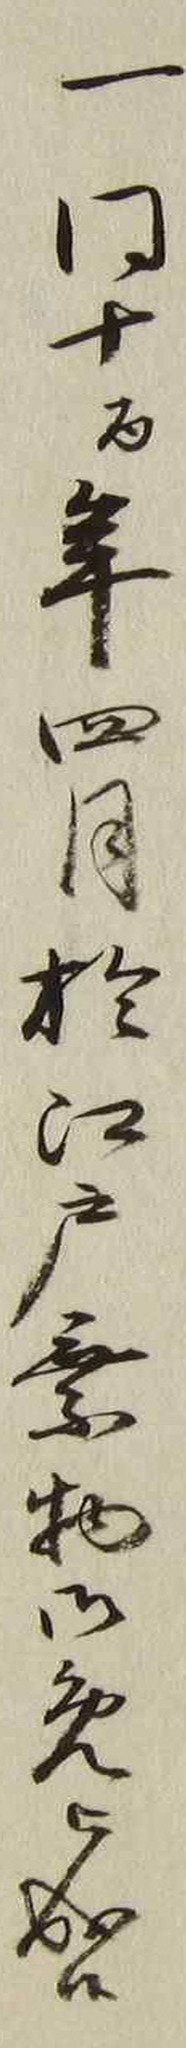一同十酉年四月於江戸乗物御免被成候
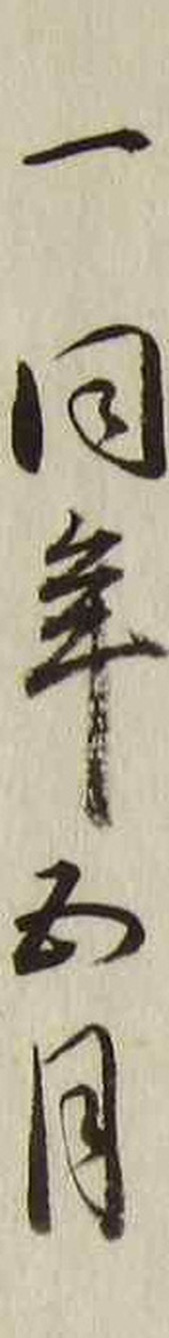一同年五月
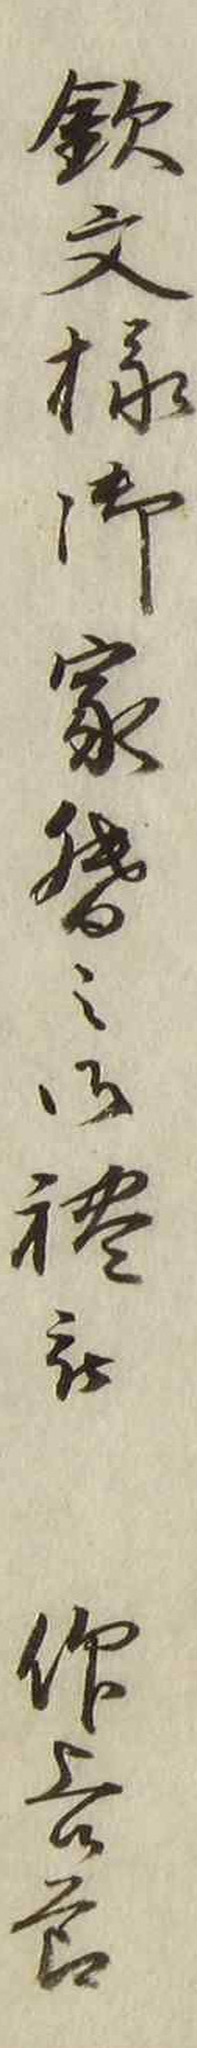欽文様御家督之御礼被仰上候節
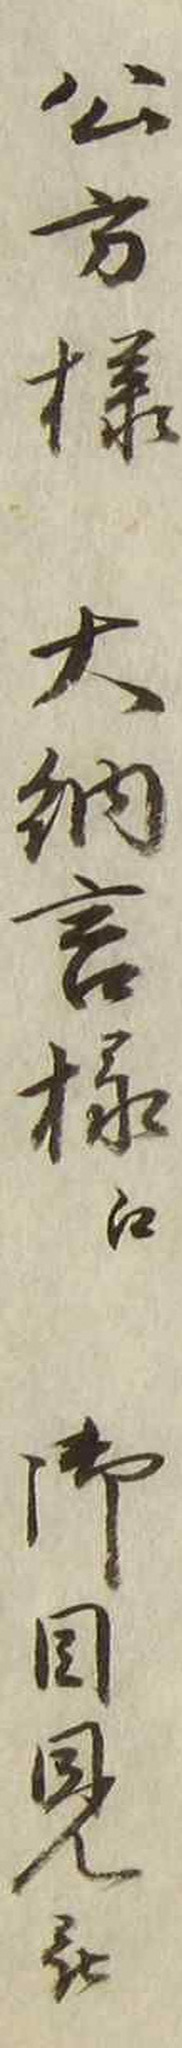公方様大納言様江御目見被

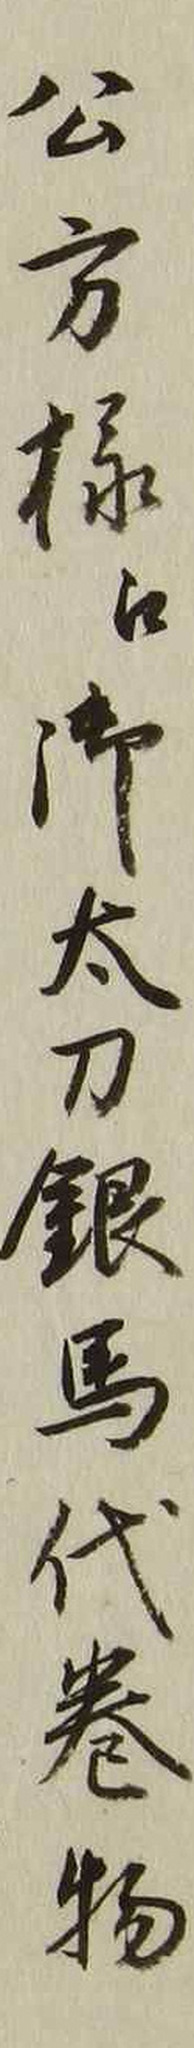公方様江御太刀銀馬代巻物
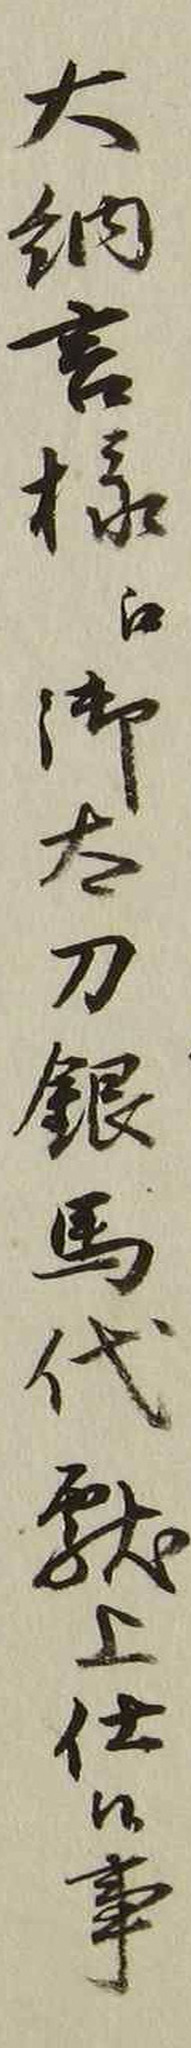大納言様江御太刀銀馬代献上仕候事
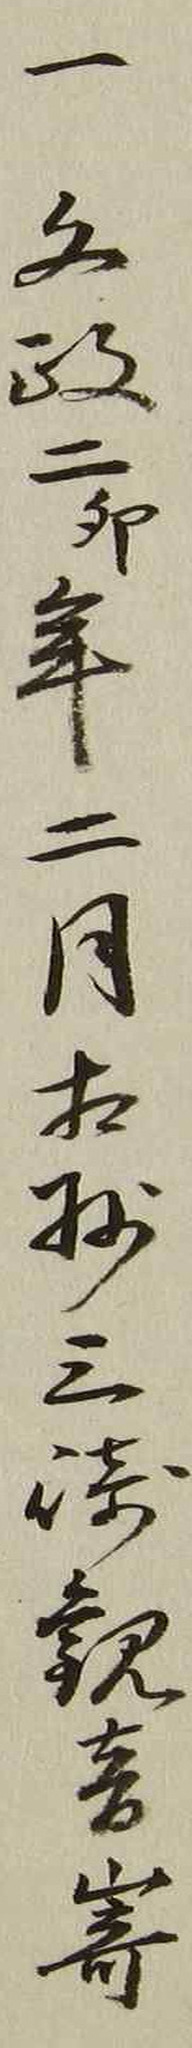一文政二卯年二月相州三崎観音崎
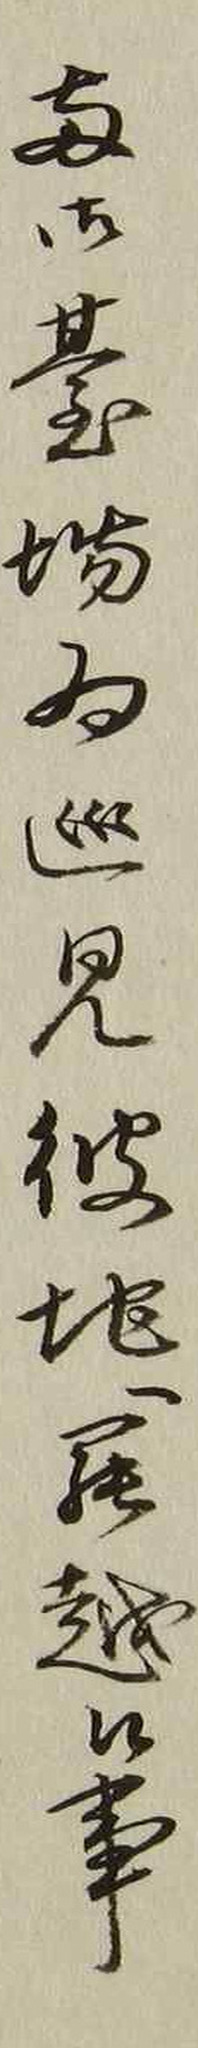両御台場為巡見彼地へ罷越候事
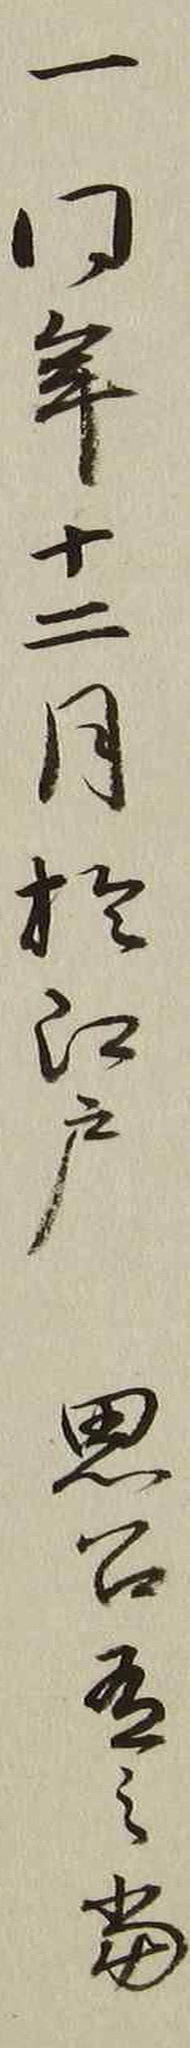一同年十二月於江戸思召有之当
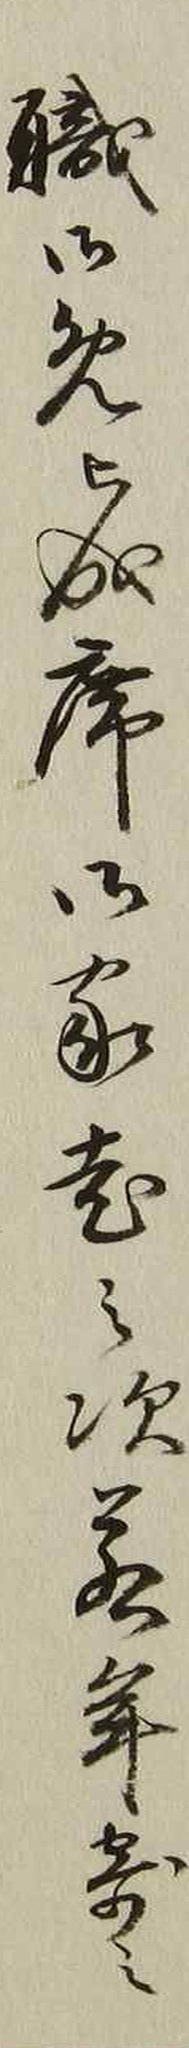職御免被成席御家老之次若年寄之
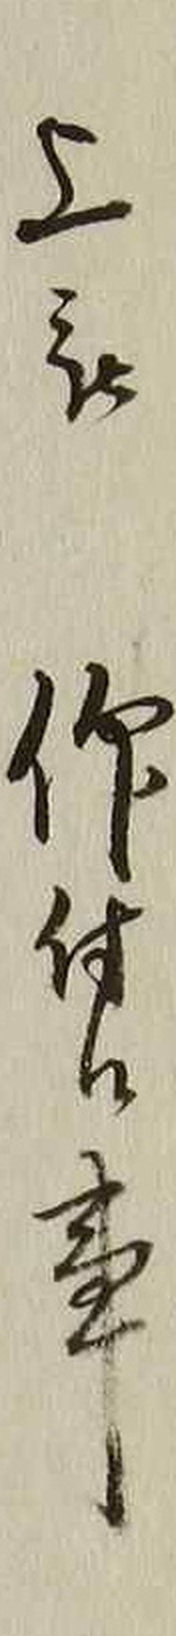上被仰付候事
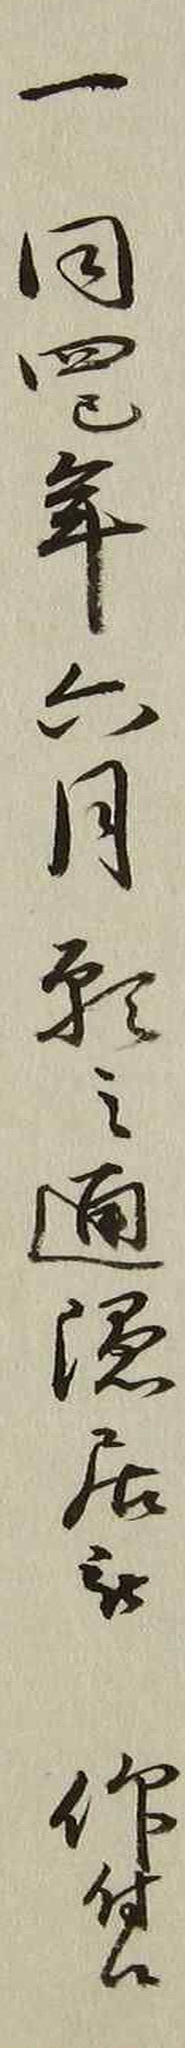一同四己年六月願之通隠居被仰付候
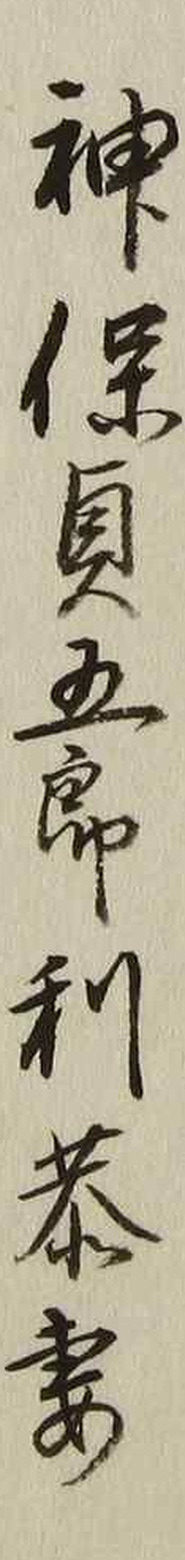女神保貞五郎利恭妻
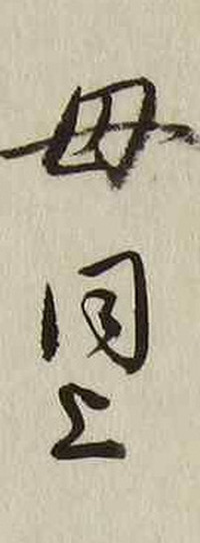母同上
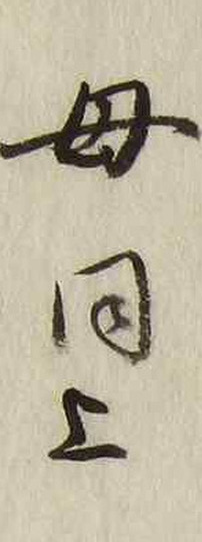母同上

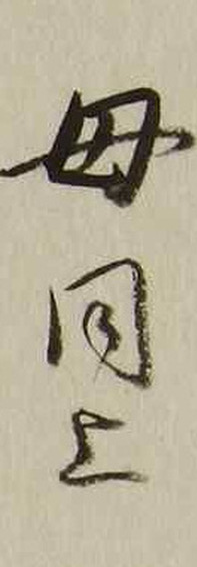母同上
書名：諸士系譜　巻之125　た之部1
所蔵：会津若松市立会津図書館
